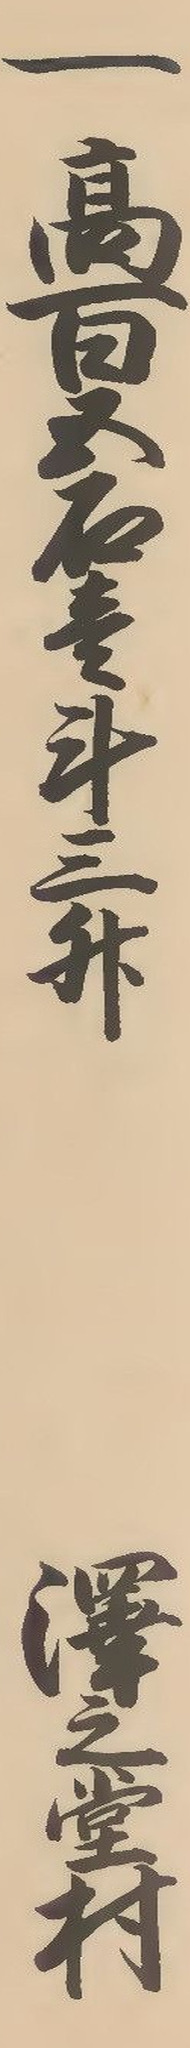一高百五石壱斗三升沢之堂村
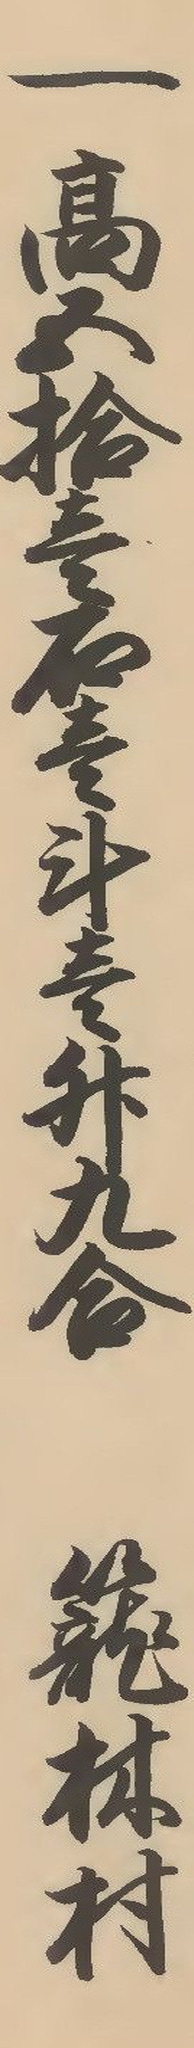一高五拾壱石壱斗壱升九合籠林村
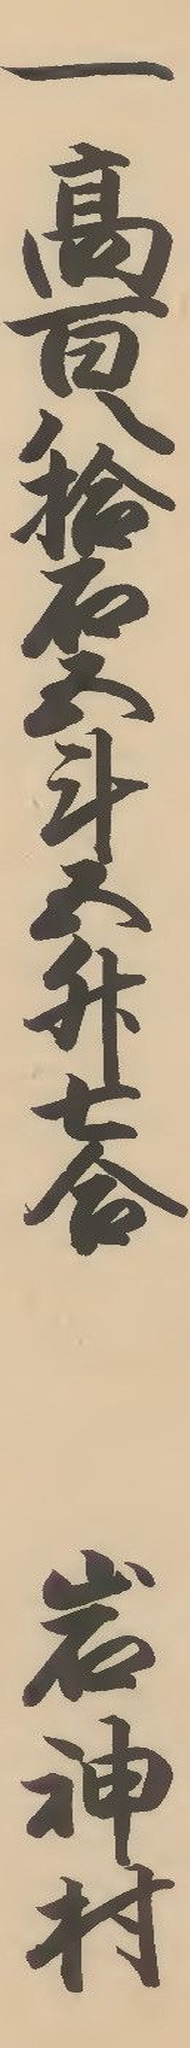一高百八拾石五斗五升七合岩神村
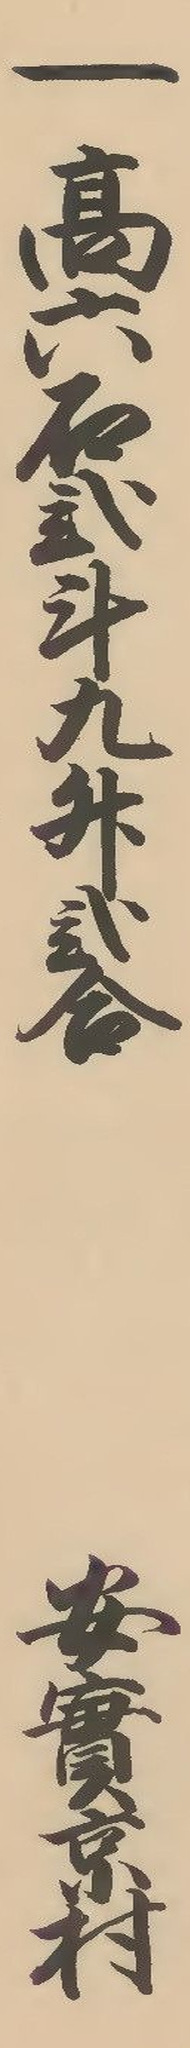一高六石弐斗九升弐合安実京村

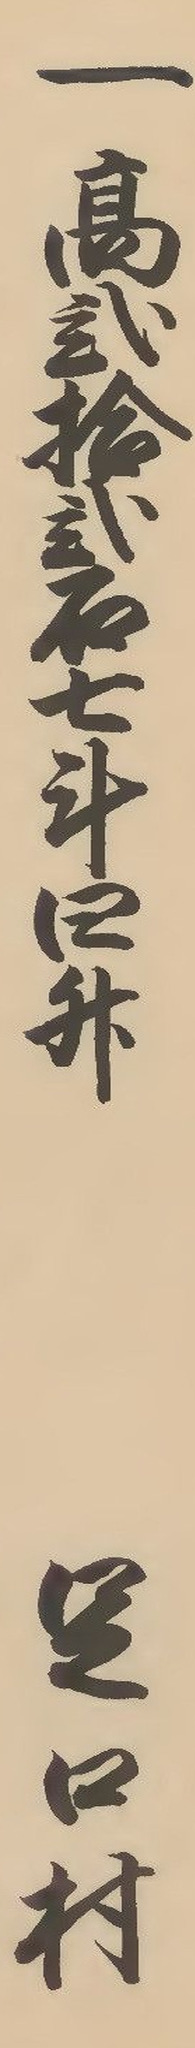一高弐拾弐石七斗四升足口村
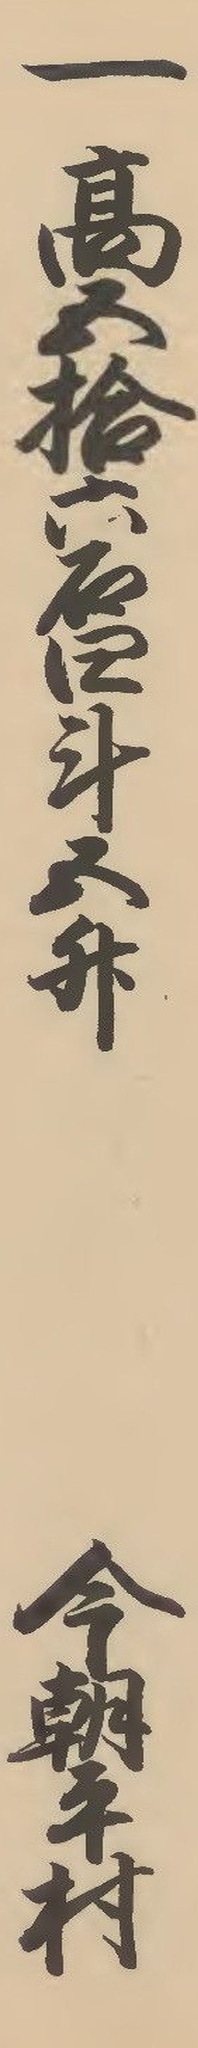一高五拾六石四斗五升今朝平村
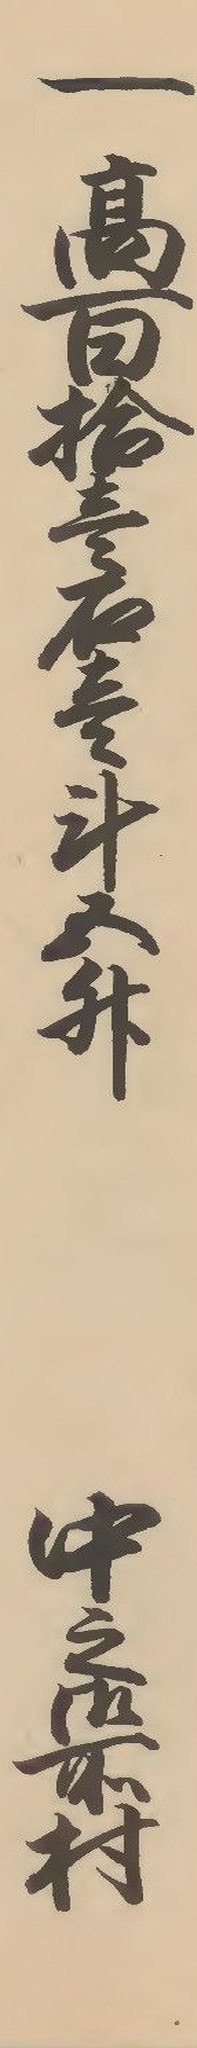一高百拾壱石壱斗五升中之御所村
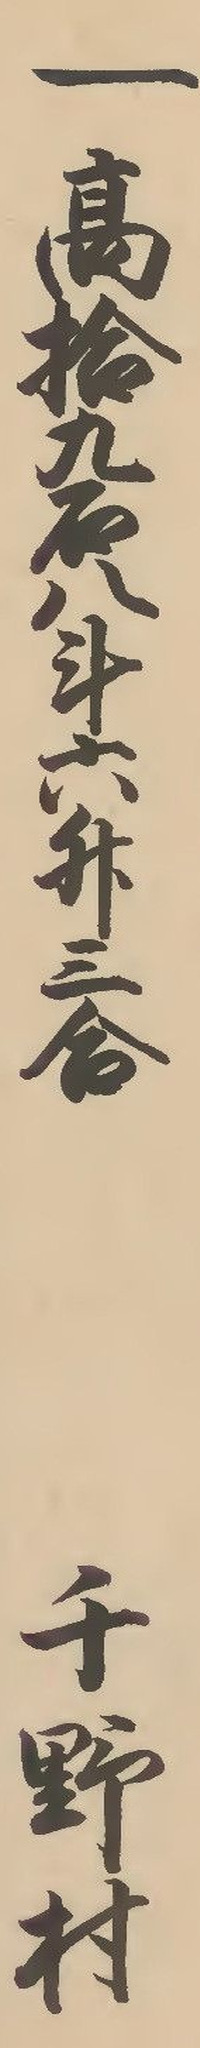一高拾九石八斗六升三合千野村
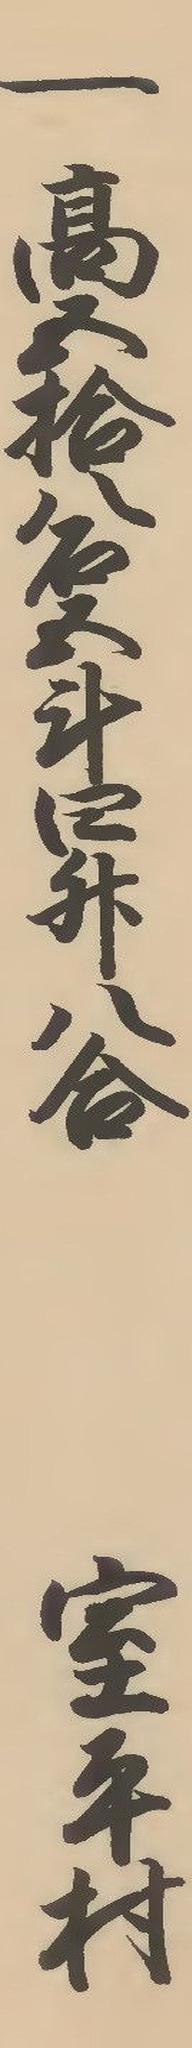一高五拾八石五斗四升八合室平村
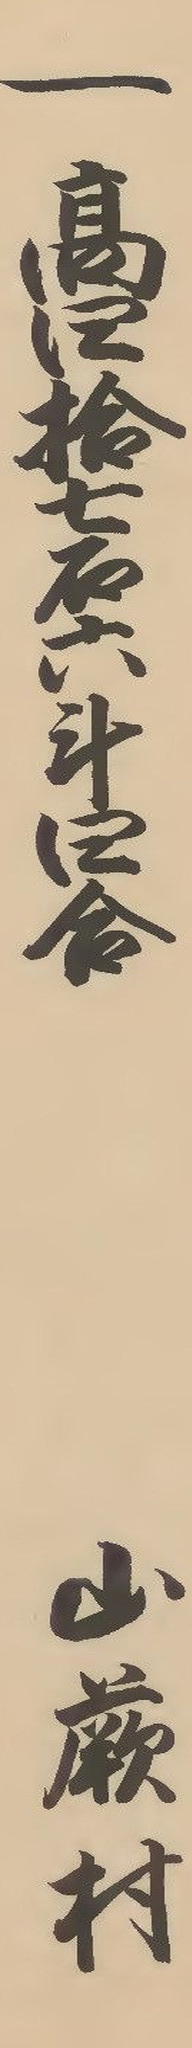一高四拾七石六斗四合山蕨村
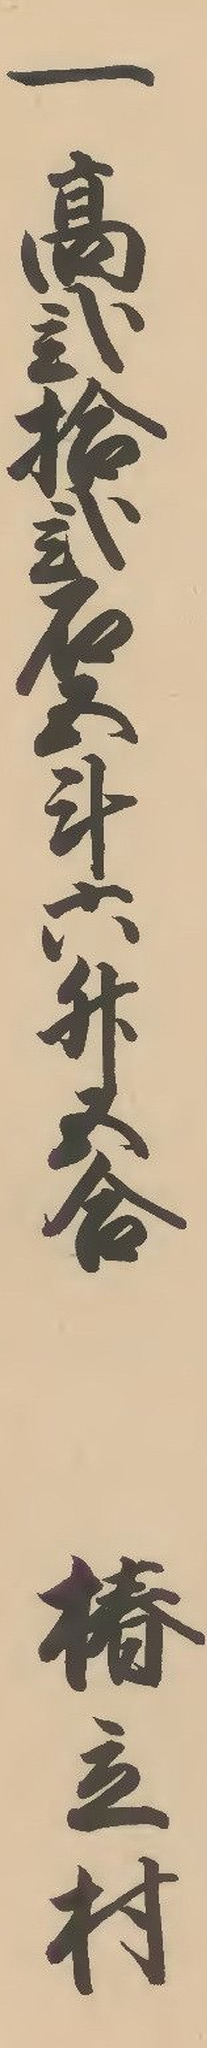一高弐拾弐石五斗六升五合椿立村

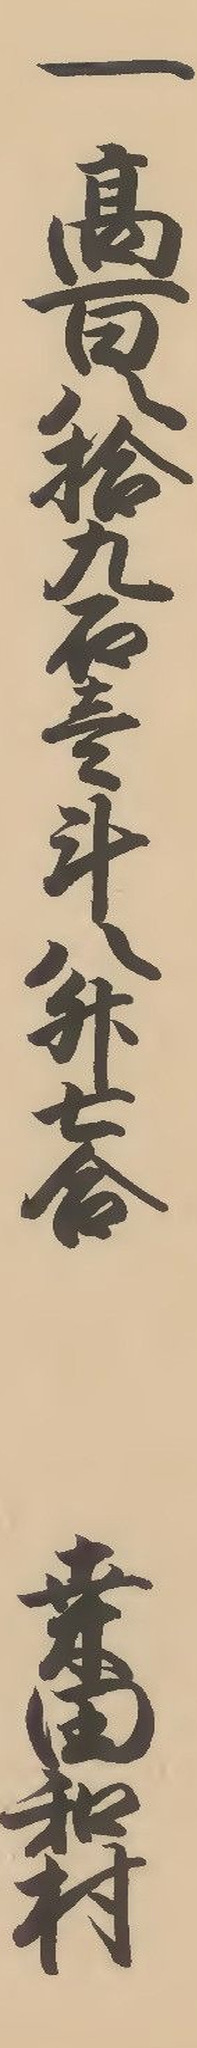一高百八拾九石壱斗八升七合桑田和村
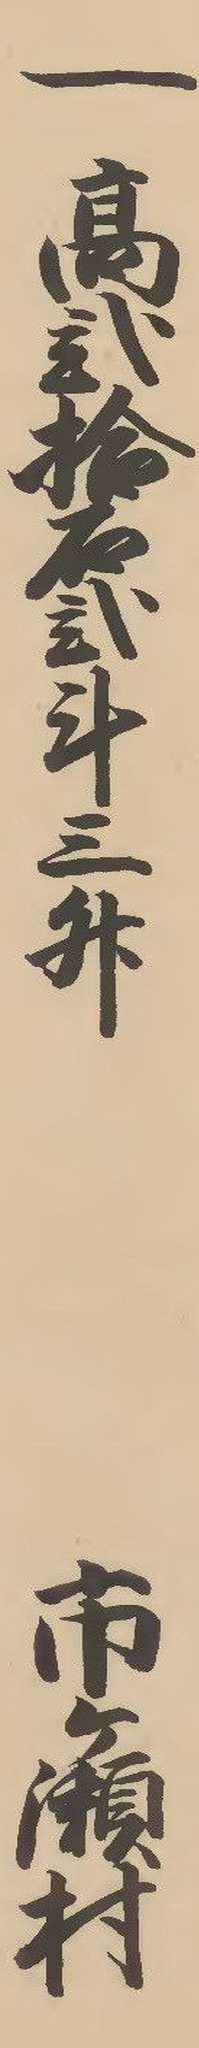一高弐拾石弐斗三升市ヶ瀬村
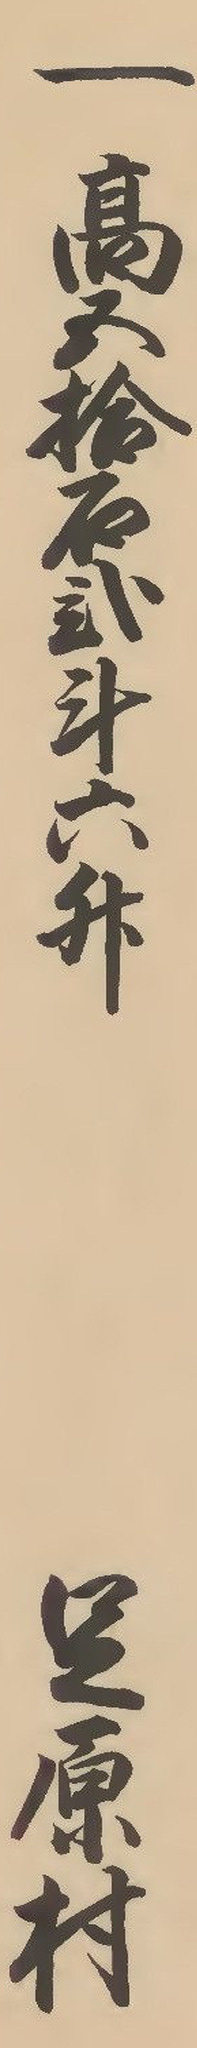一高五拾石弐斗六升足原村
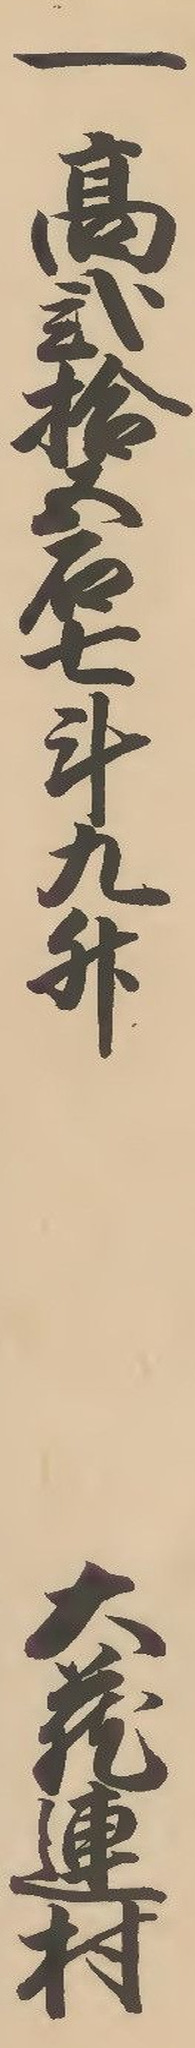一高弐拾五石七斗九升大蔵連村
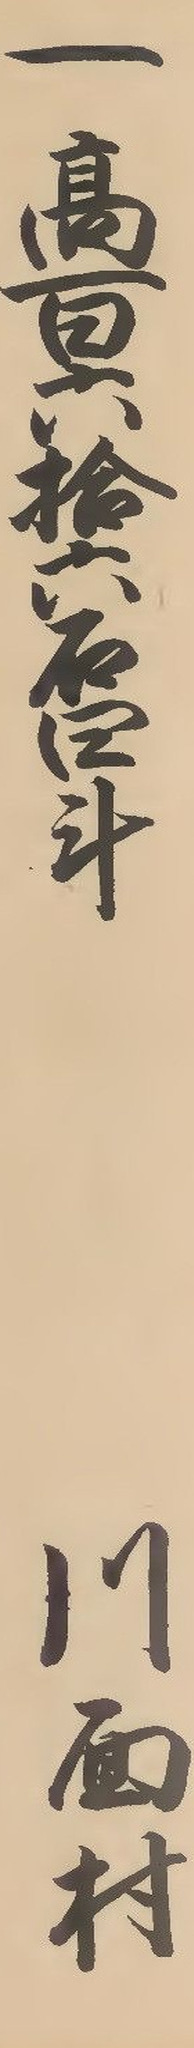一高百六拾六石四斗川面村
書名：三河国郷帳
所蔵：国立公文書館 National Archives of Japan
